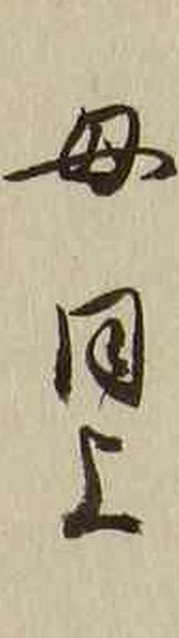母同上
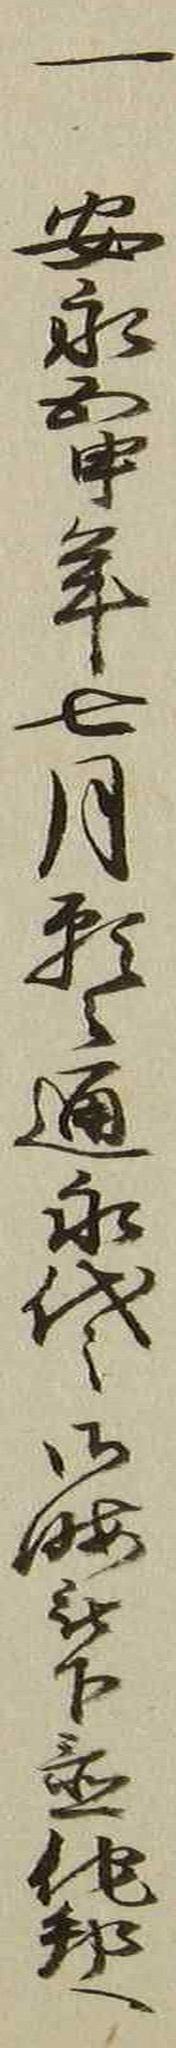一安永五申年七月願之通永代之御暇被下置他邦へ
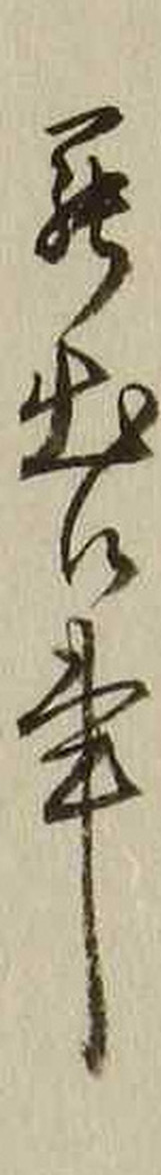罷出候事
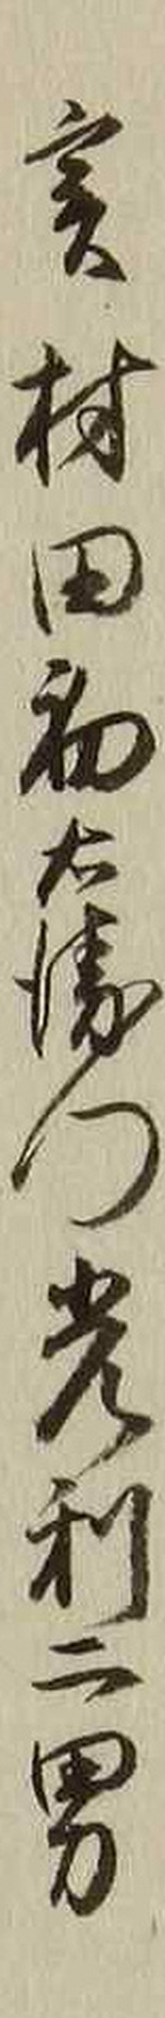実村田初右衛門光利二男
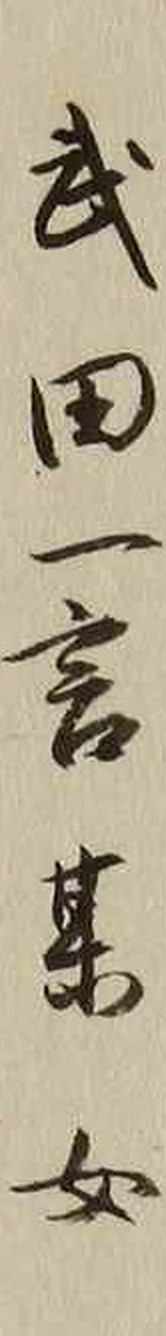武田一言某女
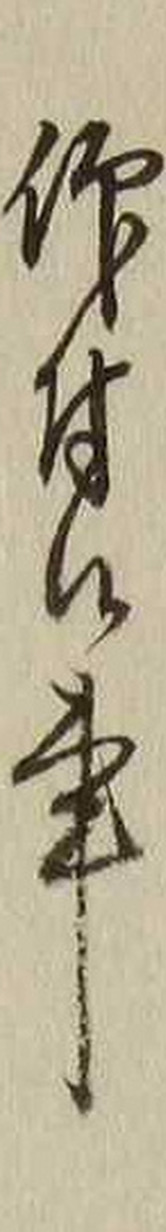仰付候事
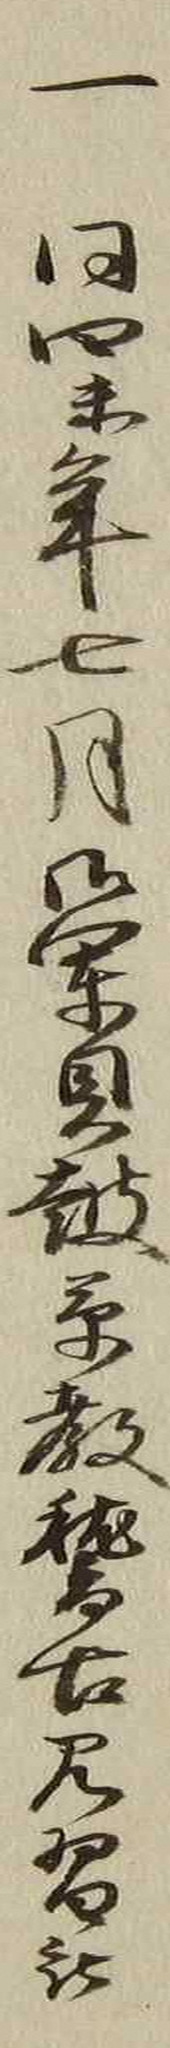一同四未年七月御軍貝鼓草教稽古見習被
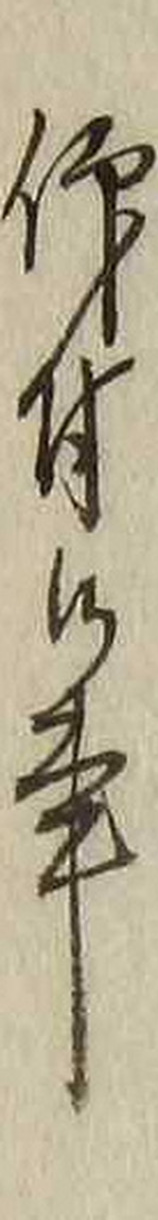仰付候事
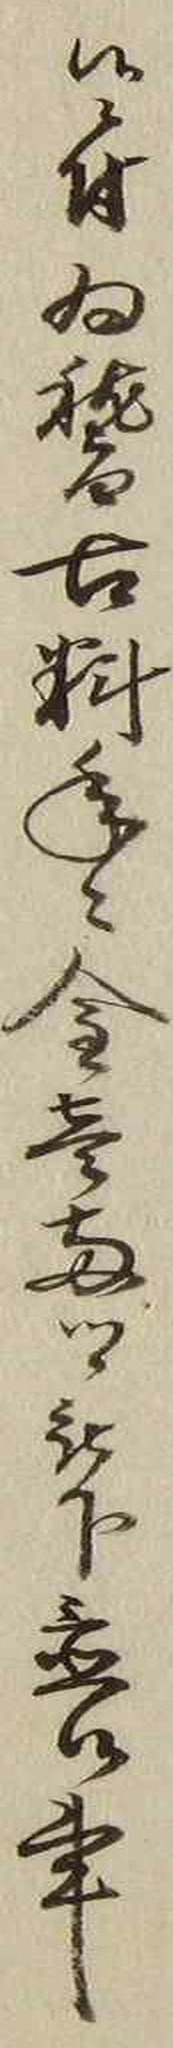候ニ付為稽古料年々金壱両ツヽ被下置候事
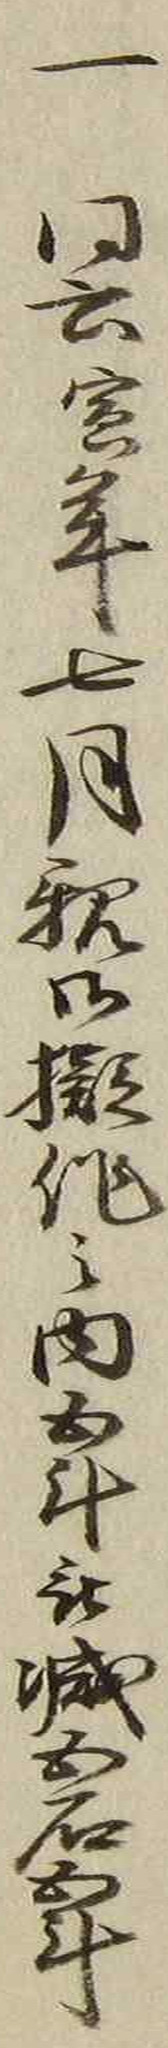一同六寅年七月親御擬作之内五斗被減五石五斗
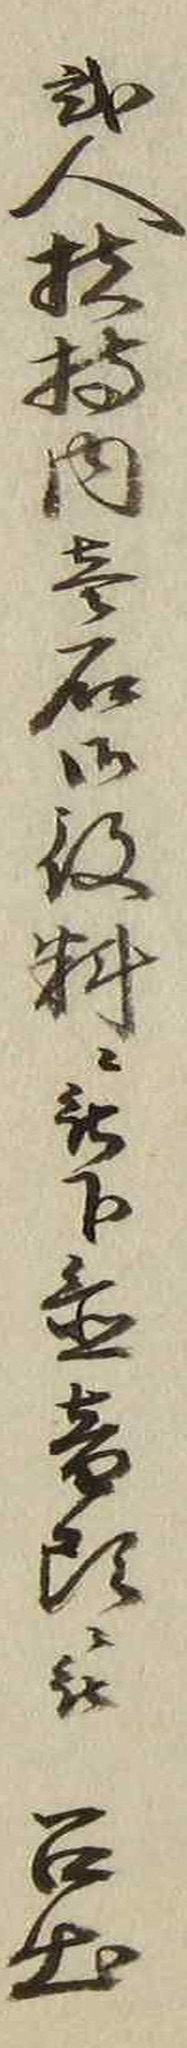弐人扶持内壱石御役料ニ被下置音頭ニ被召出
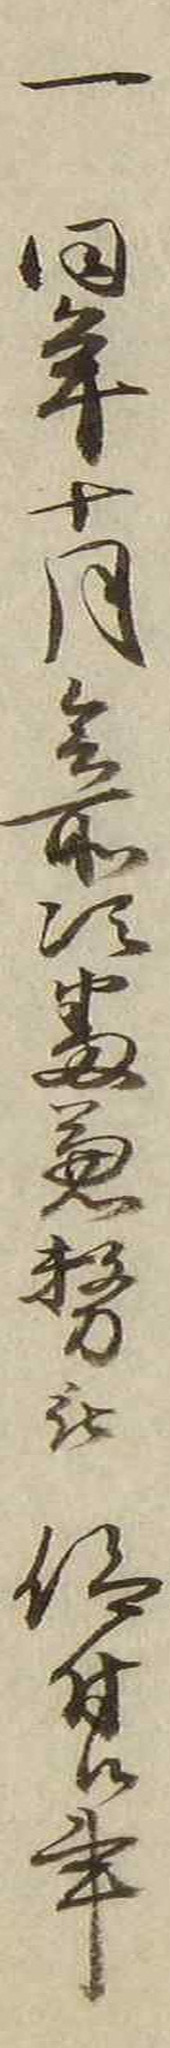一同年十月会所次番兼務被仰付候事

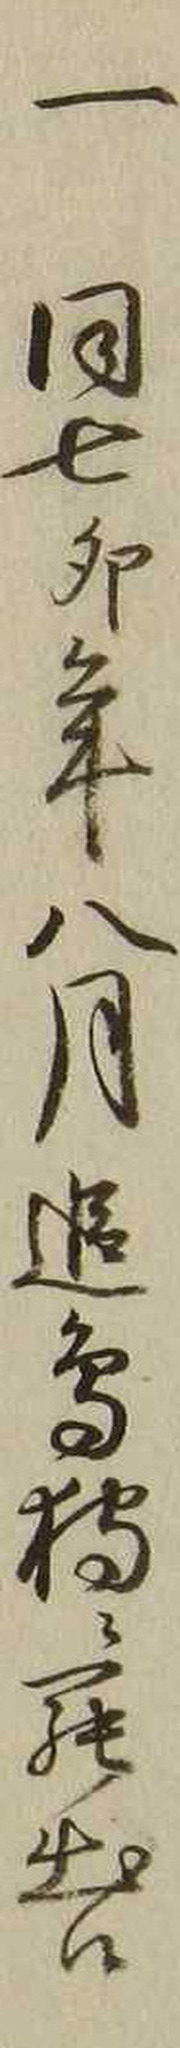一同七卯年八月追鳥狩ニ罷出候
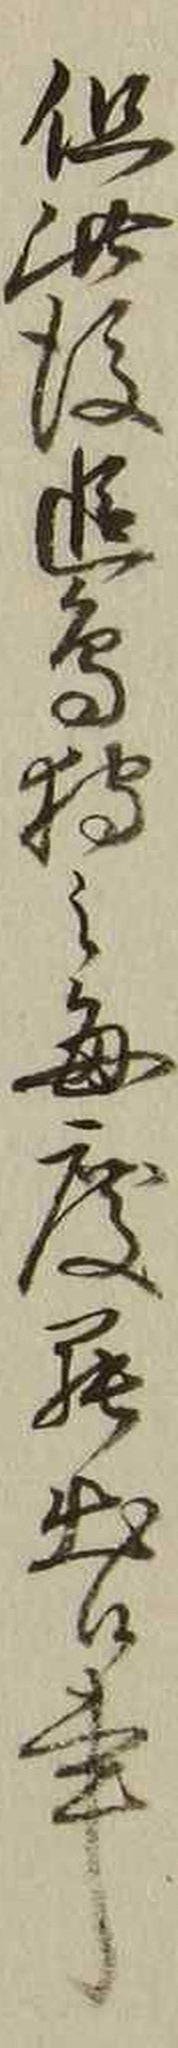但此後追鳥狩之毎度罷出候事
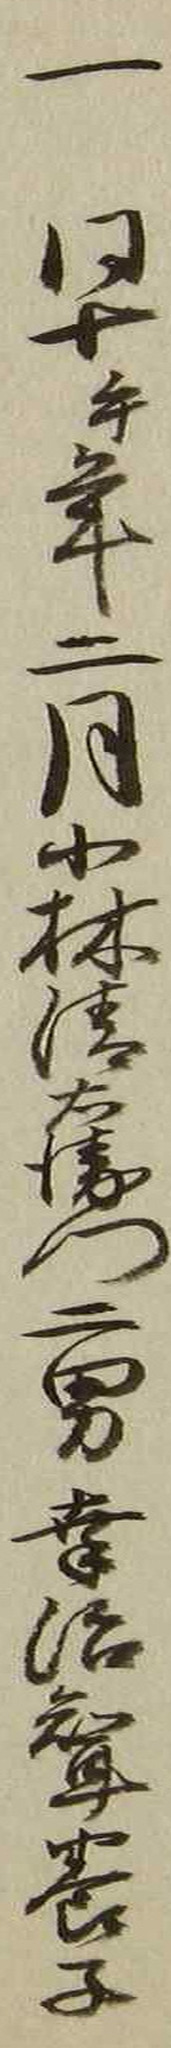一同十午年二月小林清右衛門二男幸治婿養子
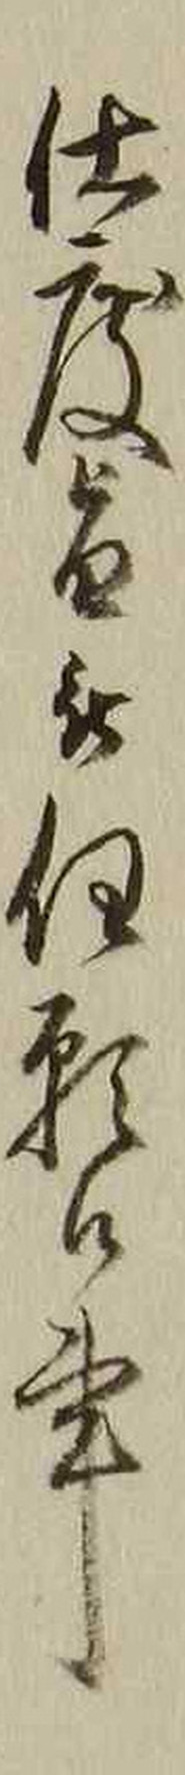仕度旨被任願候事
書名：諸士系譜　巻之102　か之部10
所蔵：会津若松市立会津図書館
